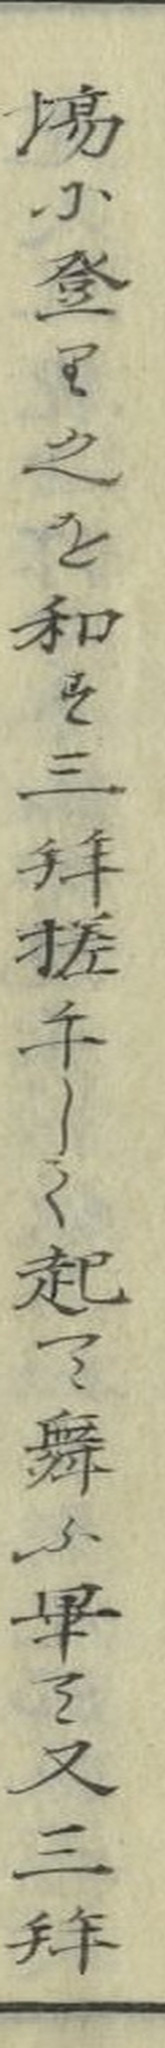場に登り之を和す三拝搓手して起て舞ふ畢て又三拝
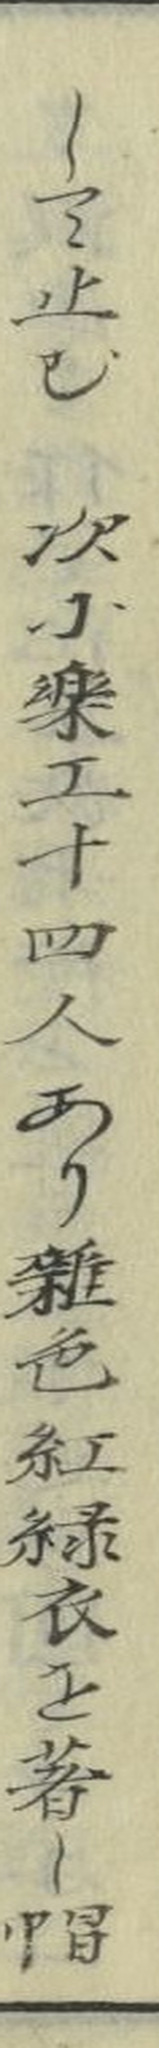して止む次に楽工十四人あり雑色紅緑衣を著し帽
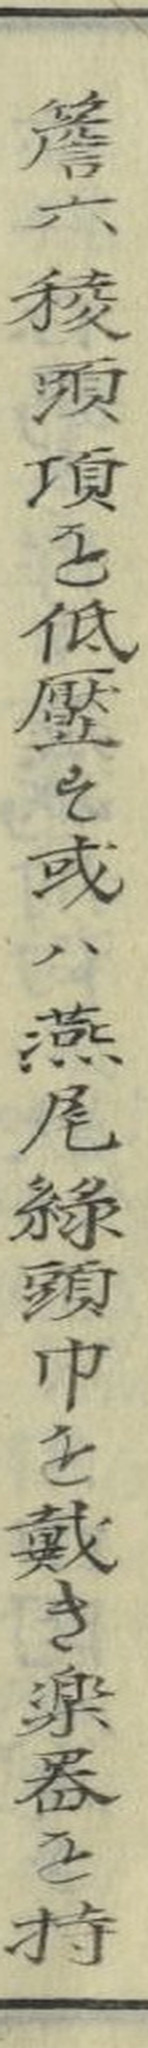簷六稜頭項を低圧す或は燕尾緑頭巾を戴き楽器を持
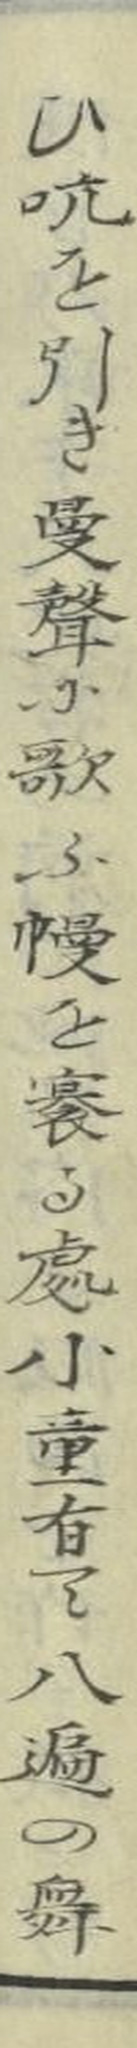ひ吭を引き曼声に歌ふ幔を褰る処小童有て八遍の舞
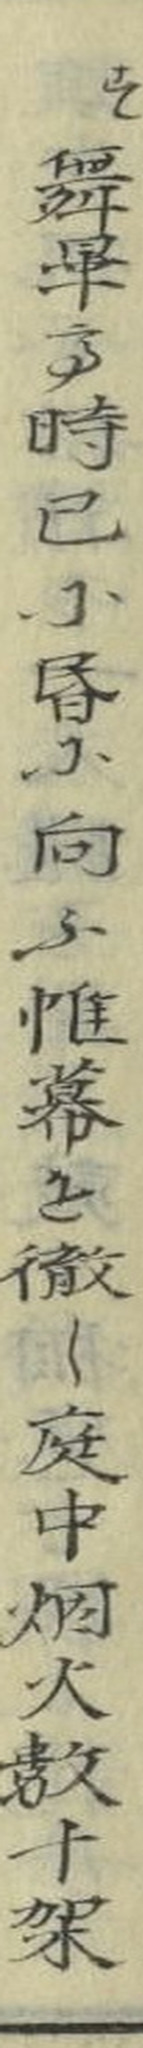す舞畢て時已に昏に向ふ帷幕を徹し庭中烟火数十架
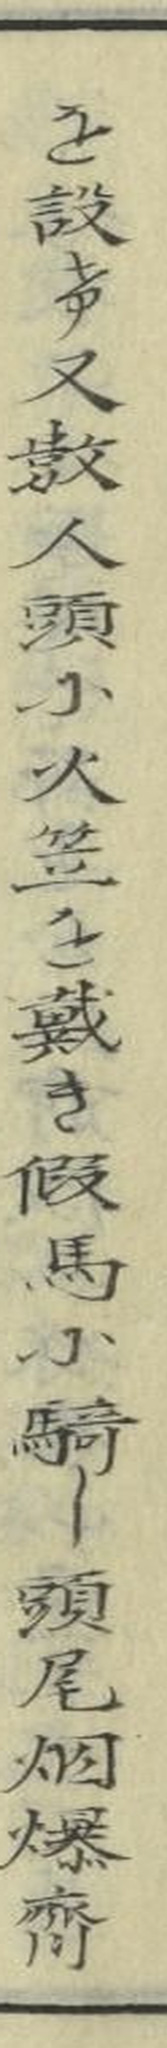を設け又数人頭に火笠を戴き仮馬に騎し頭尾烟爆齊
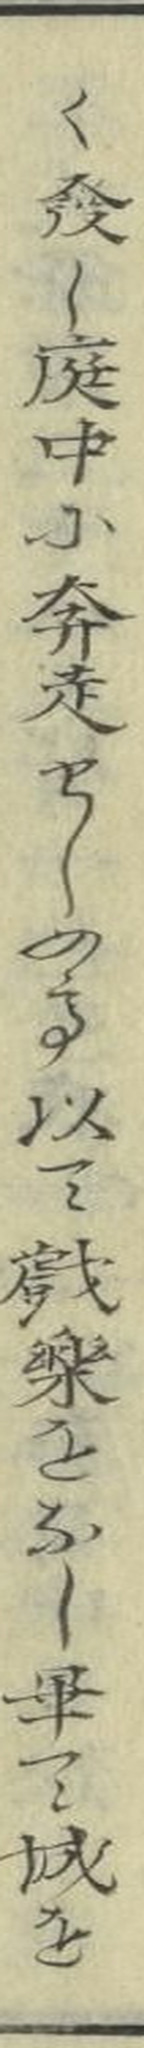く発し庭中に奔走せしめて以て戯楽をなし畢て城を
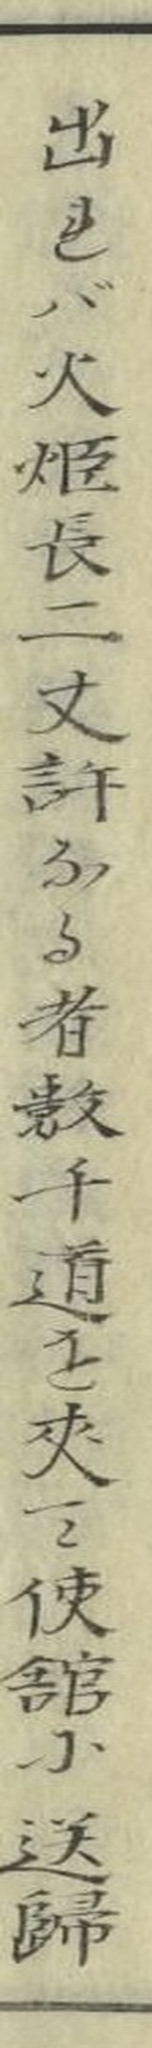出れば火炬長二丈許なる者数千道を夾て使館に送帰
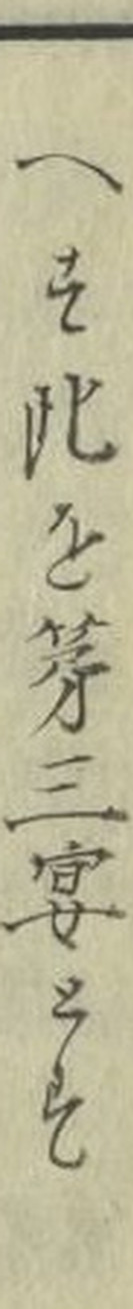へす此を第三宴とす
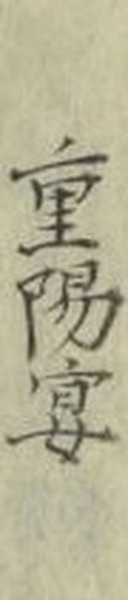重陽宴
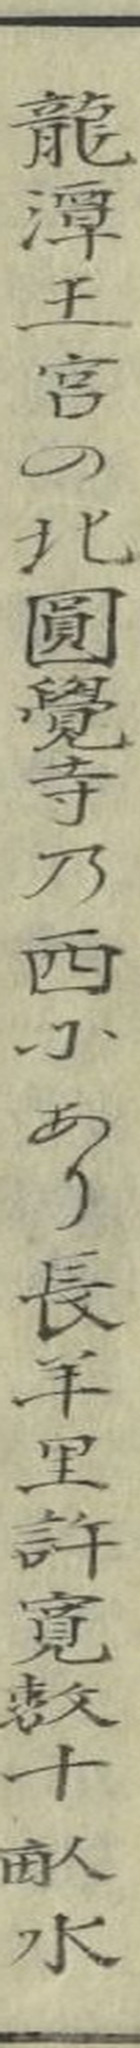龍潭王宮の北円覚寺の西にあり長半里許寛数十畝水
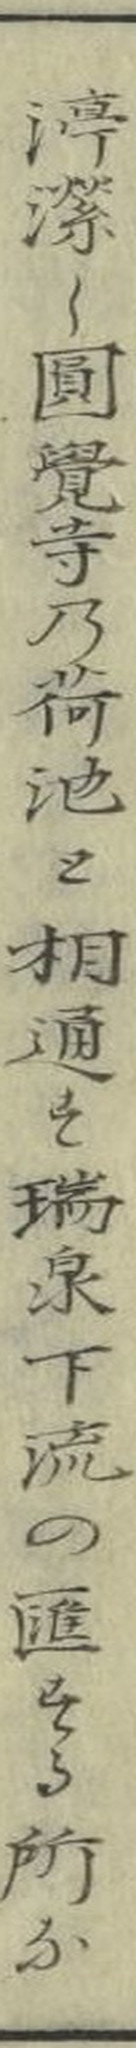渟瀠し円覚寺の荷池と相通す瑞泉下流の匯する所な
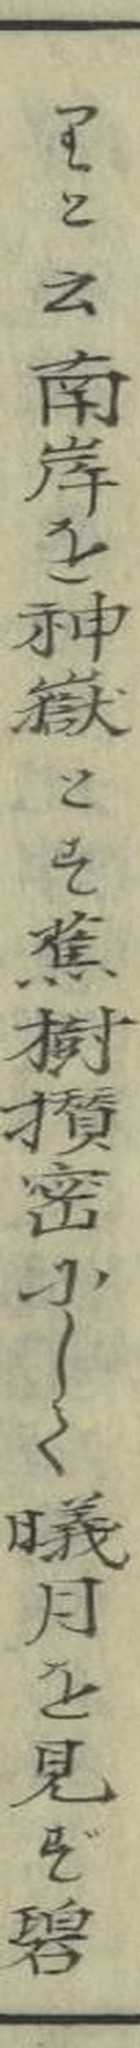りと云南岸を神嶽とす蕉樹攅密にして曦月を見ず碧

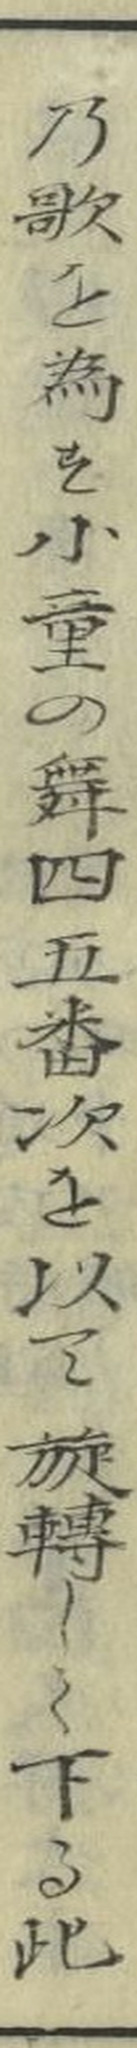の歌を為す小童の舞四五番次を以て旋転して下る此
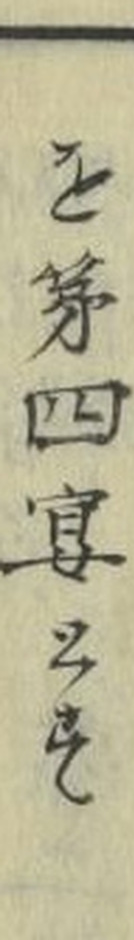を第四宴とす
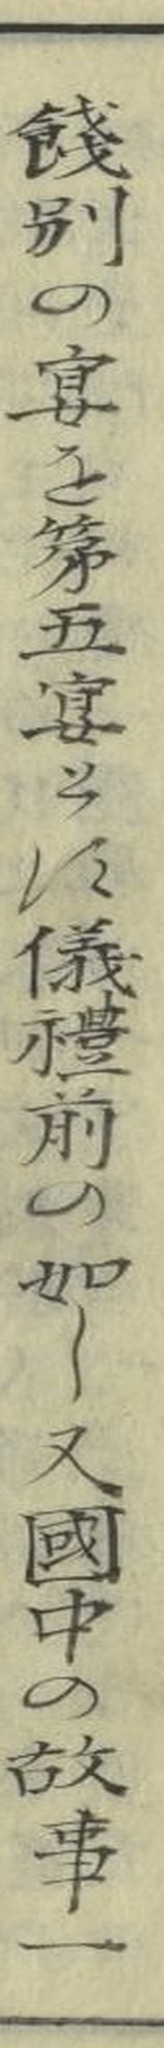餞別の宴を第五宴とす儀礼前の如し又国中の故事一
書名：琉球沿革志 下
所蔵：University of the Ryukyus Library
